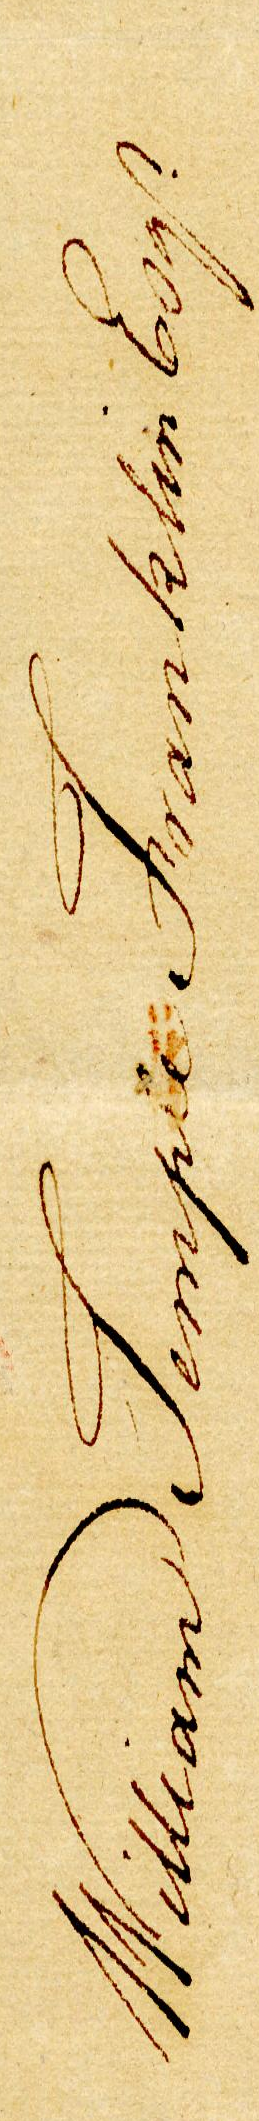William Temple Franklin Esq^r.
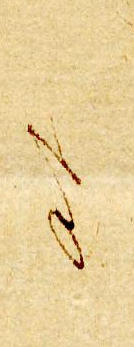at
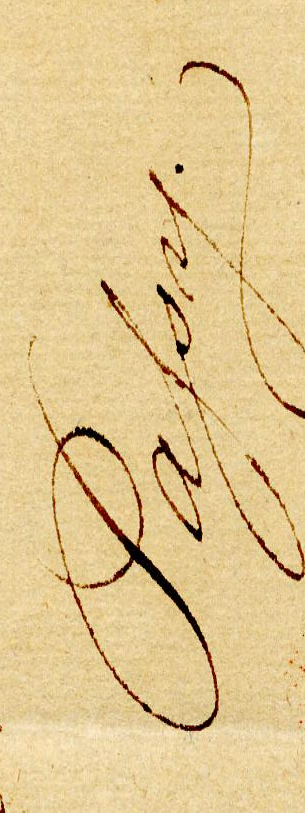Passy.
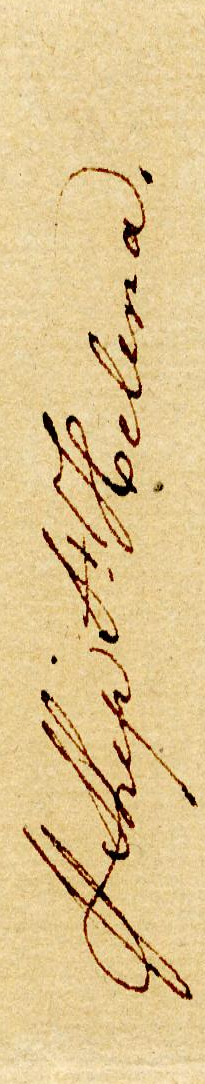per Ship S^t. Helena.
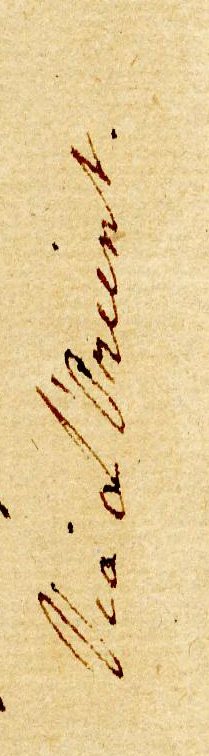Via L'Orient.
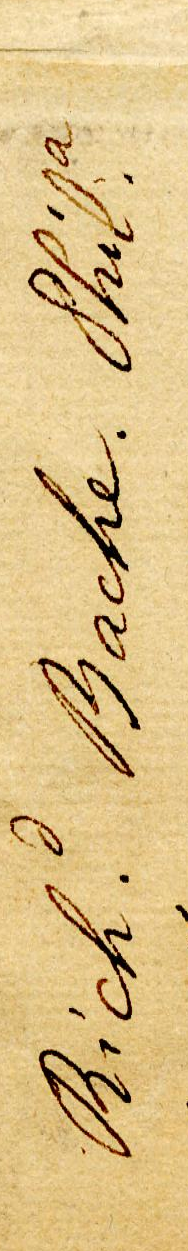Rich.^d Bache. Phil^a.
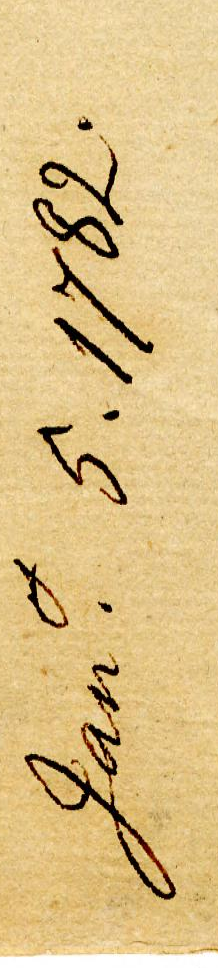Jan^y. 5. 1782.
